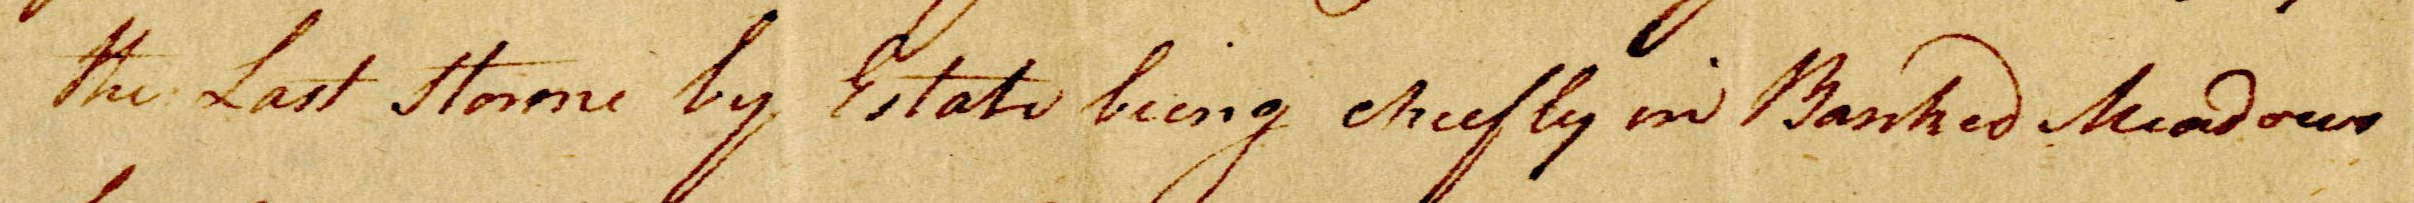the Last Storm by Estate being chiefly in Banked Meadows
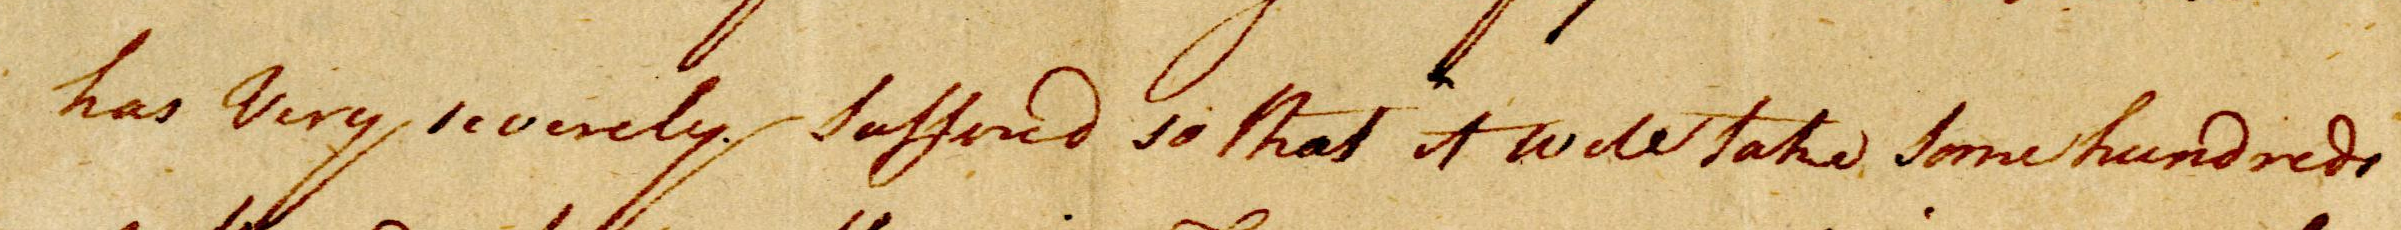has Very severely, Suffered so that it will take Some hundreds
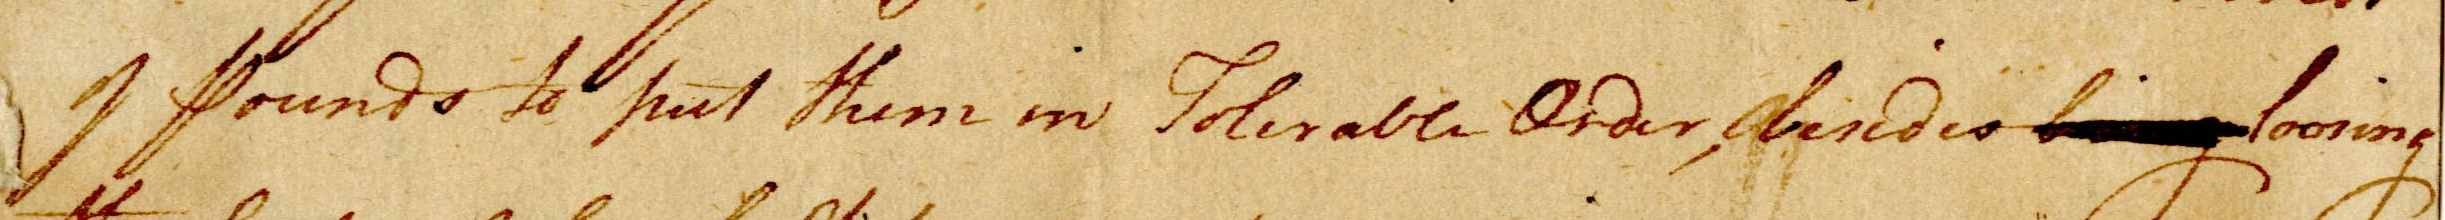of pounds to put them in Tolerable order besides [____] loosing
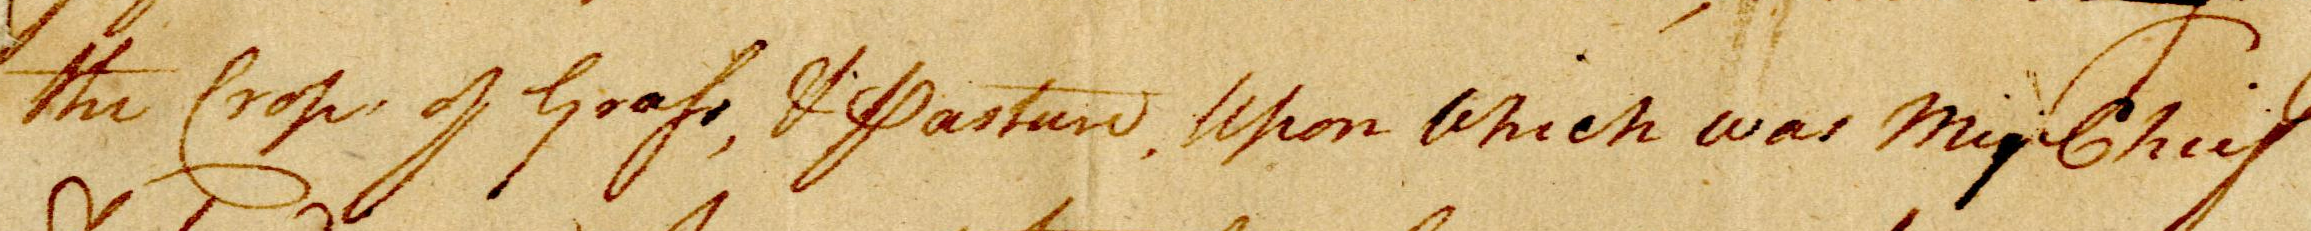the Crop of Grass, & Pasture upon Which was My Chief
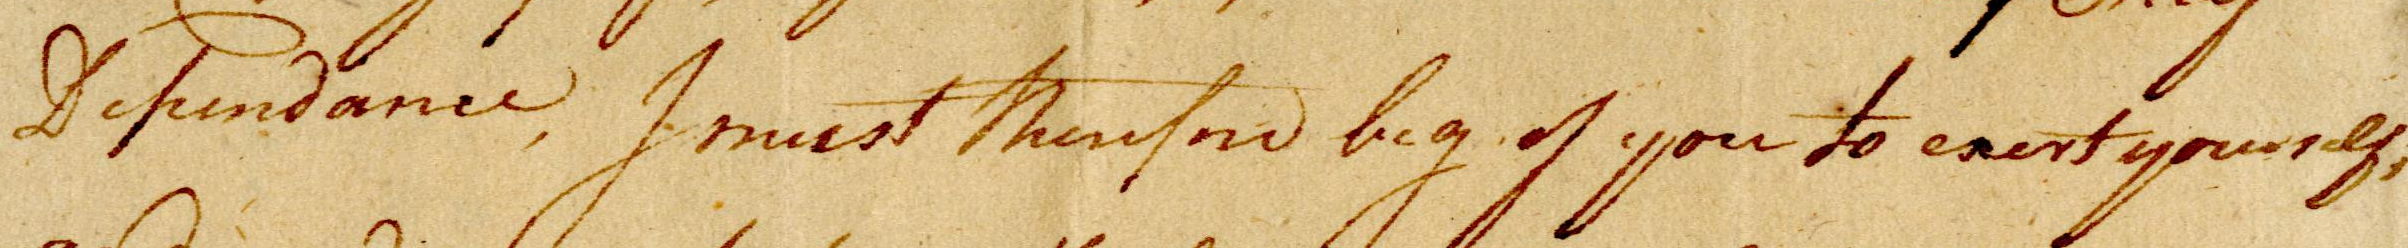Dependence, I must therefore beg of you to exert yourself
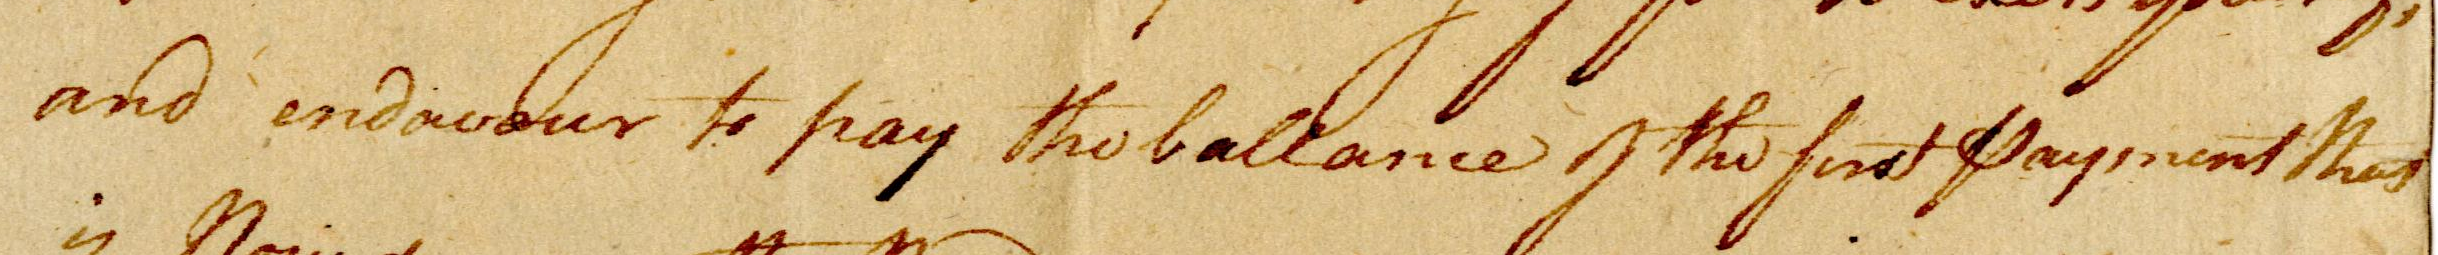and endaevor to pay the ballance of the first payment that
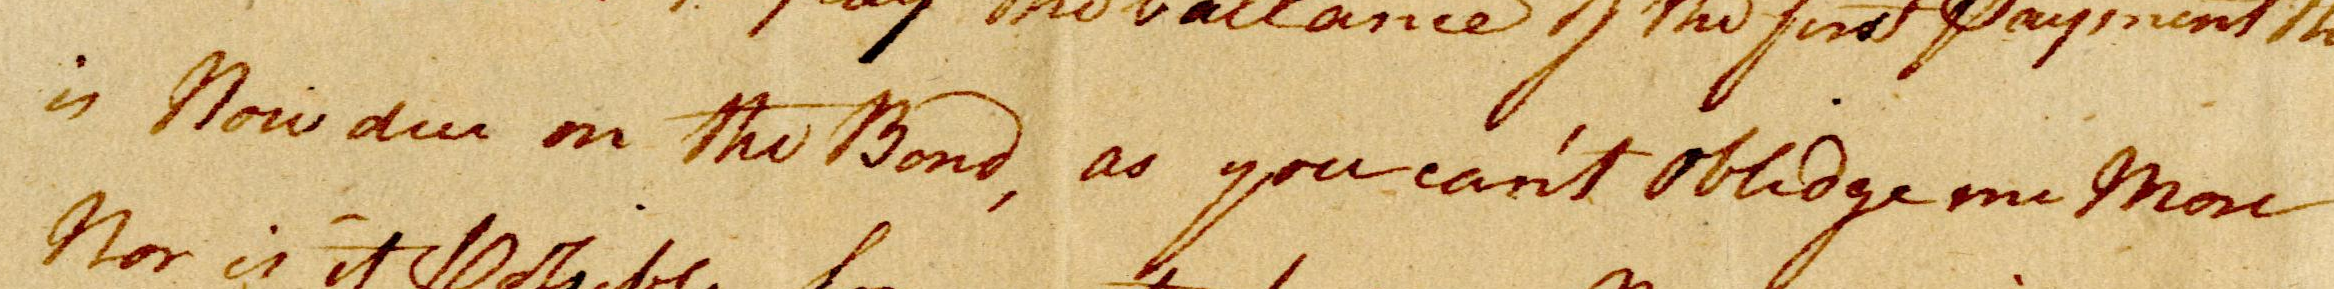is Now due on the Bond as you cant oblidge me More
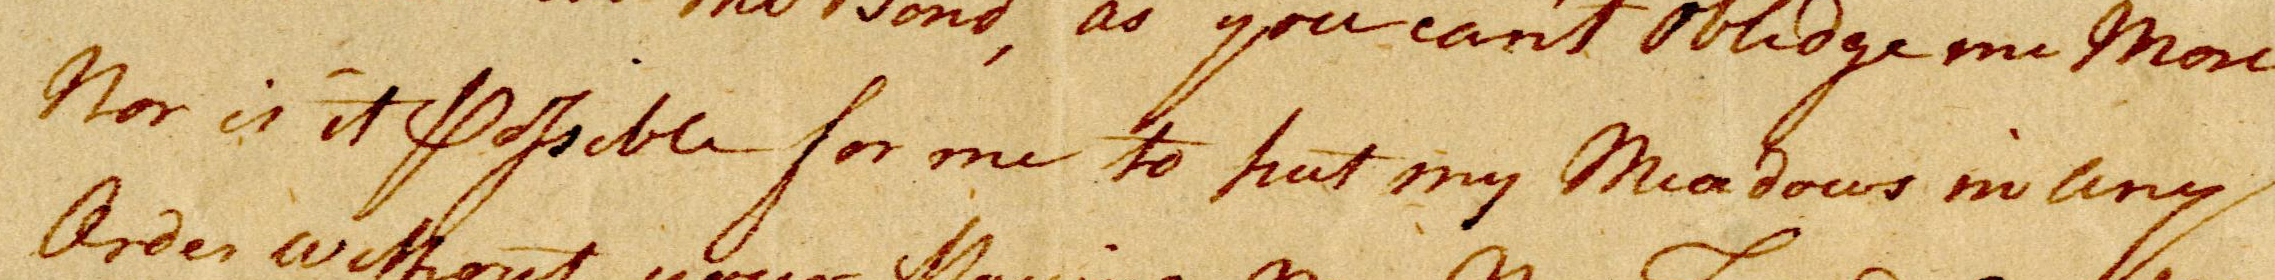Nor is it Possible for me to put my Meadows in any
